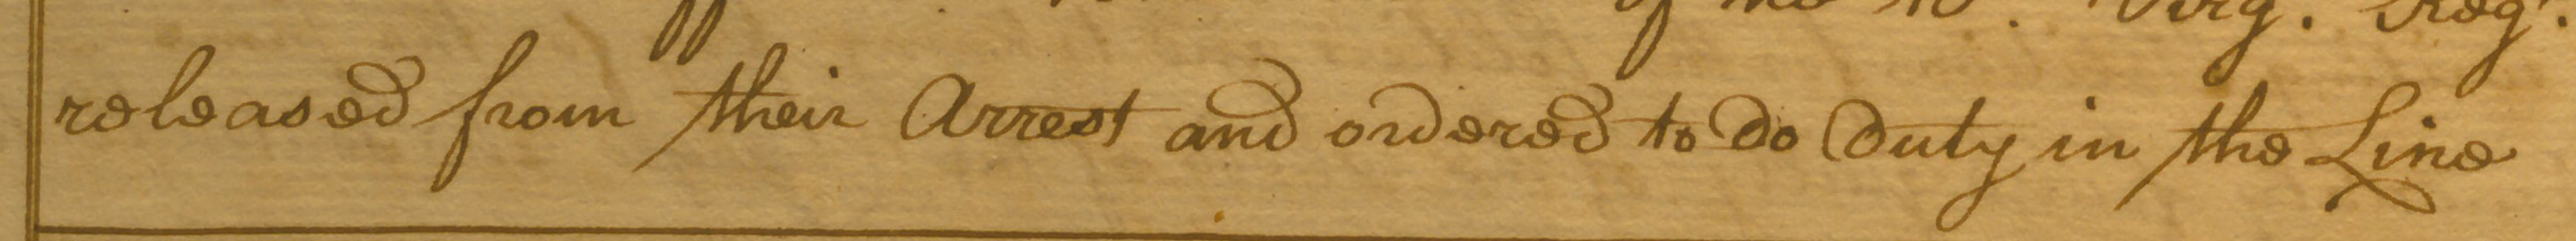released from their Arrest and ordered to do duty in the line
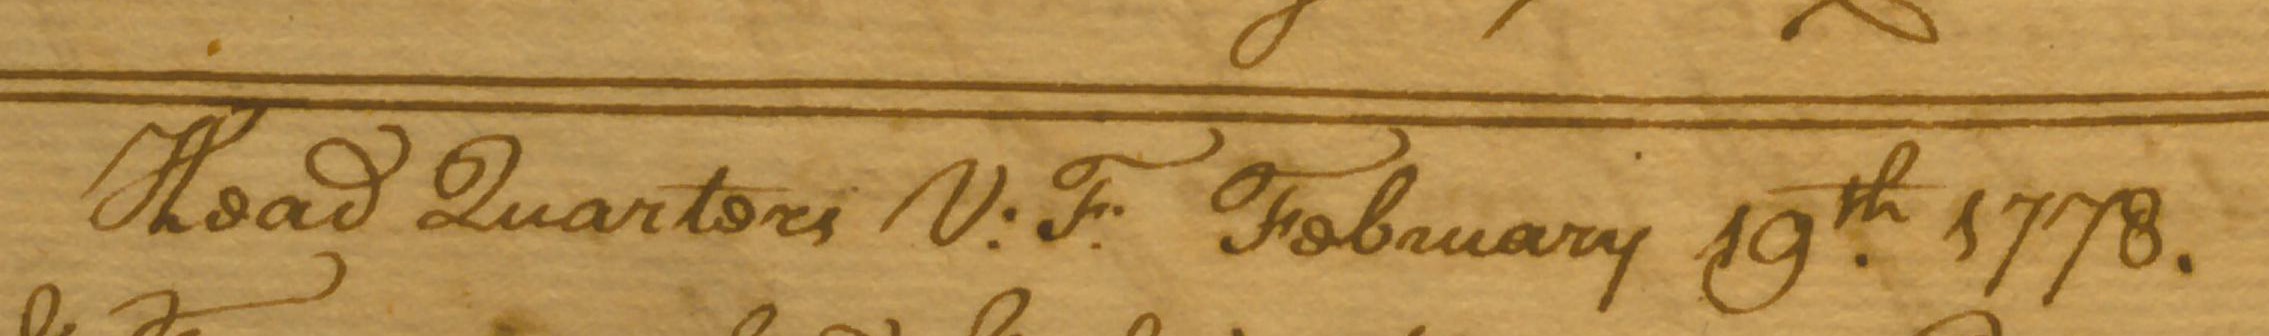Head Quarters V: F: February 19^th. 1778.
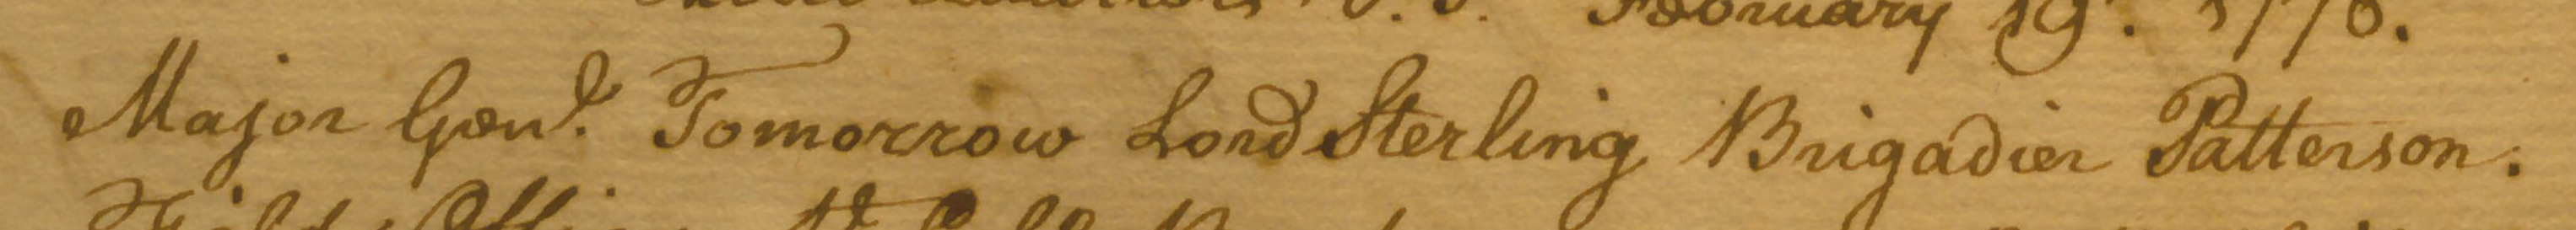Major Gen^l. Tomorrow Lord Sterling Brigadier Patterson.
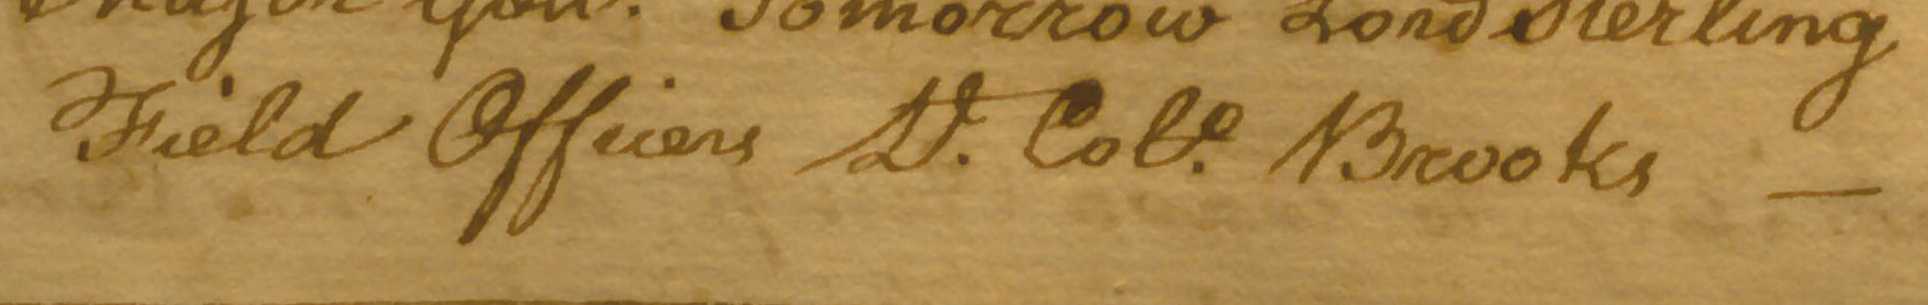Field Officers L^t. Col^o. Brooks-
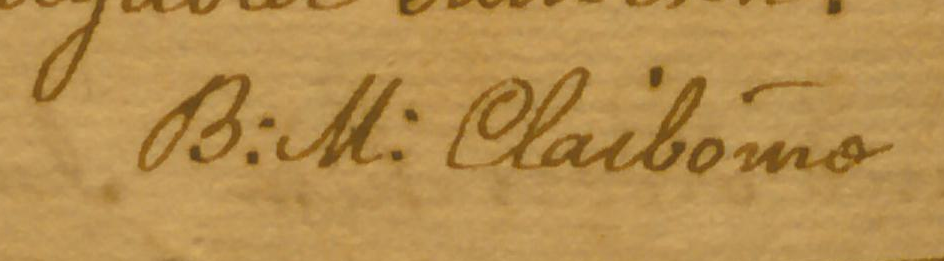B: M: Claiborne
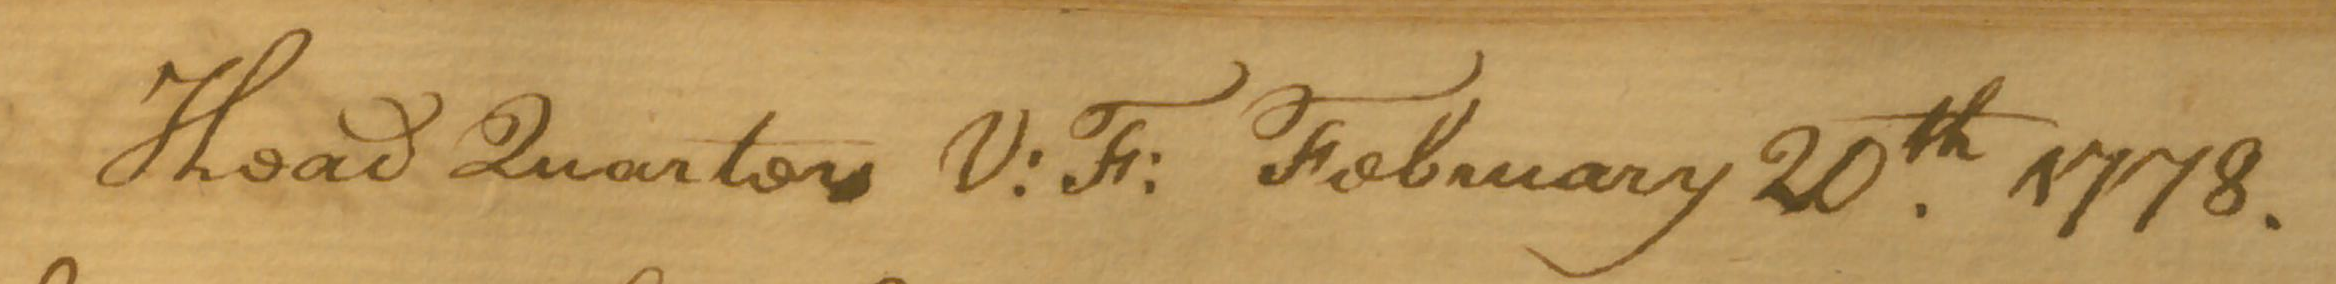Head Quarters V: F: February 20^th. 1778.
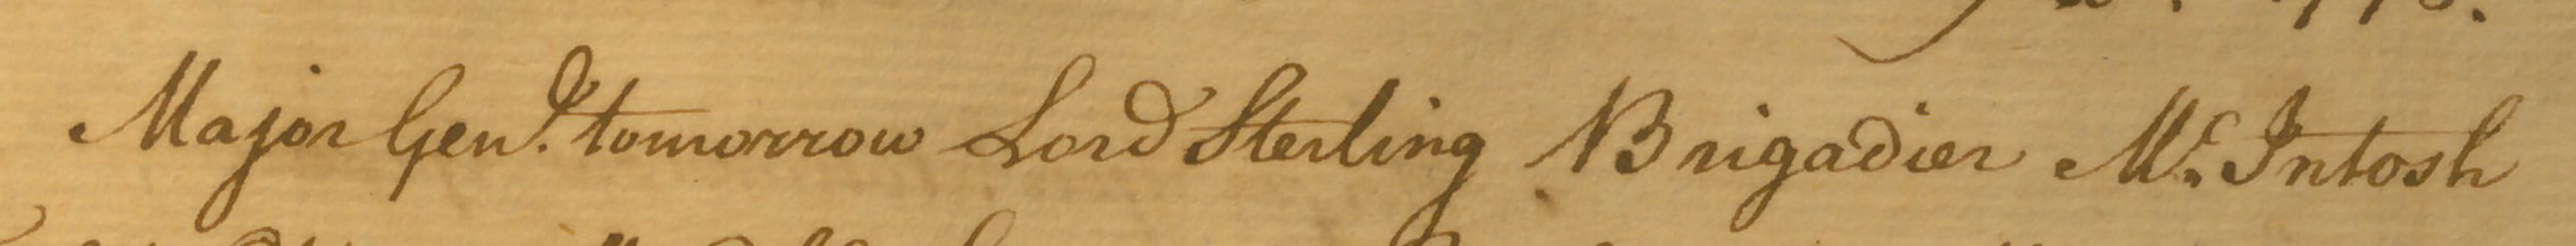Major Gen^l. tomorrow Lord Sterling Brigadier M^c.Intosh
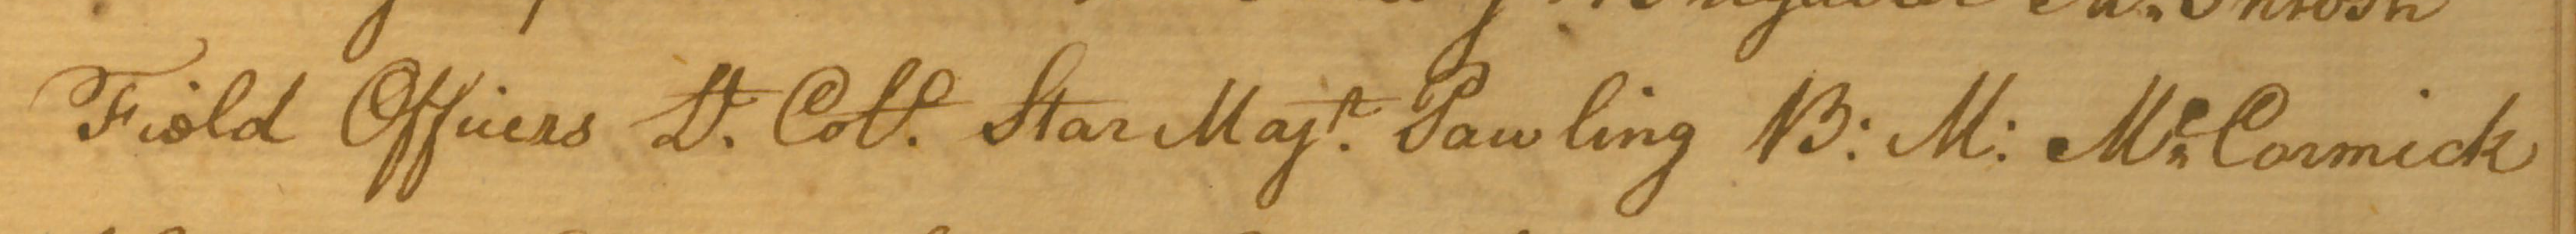Field Officers L^t. Col^o. Star Maj^r. Pawling B: M: M^cCormick
